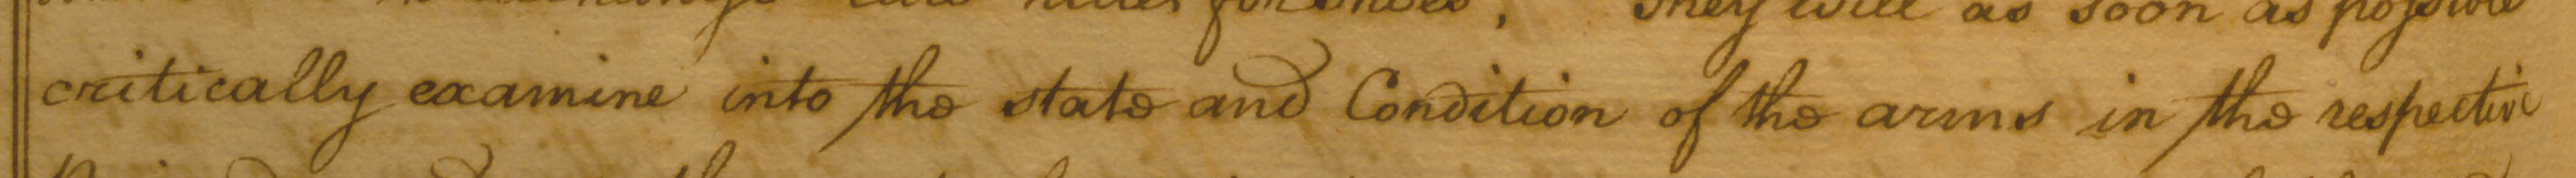critically examine into the state and Condition of the arms in the respective
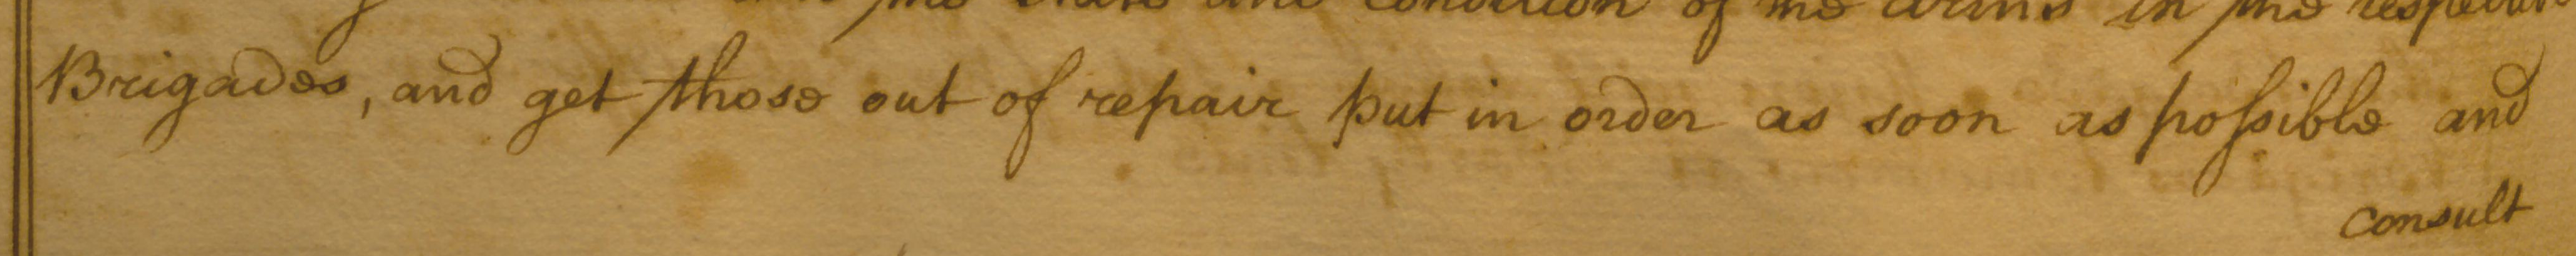Brigades, and get those out of repair put in order as soon as possible and
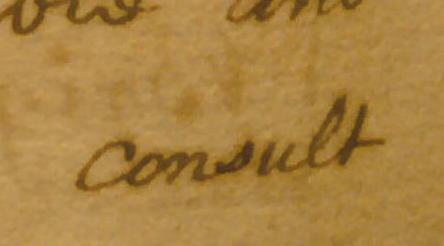consult
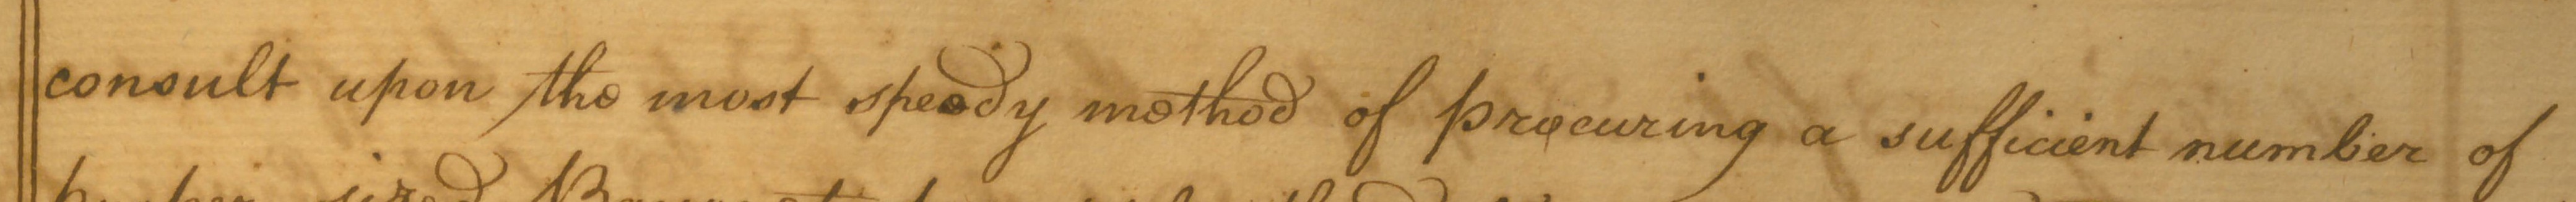consult upon the most speedy method of procuring a sufficient number of
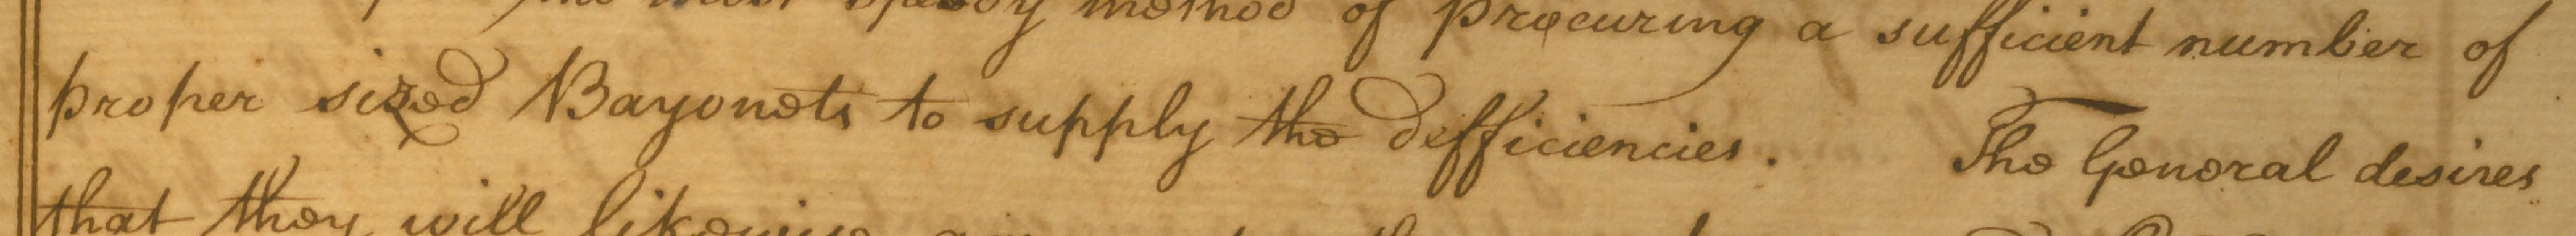proper sized Bayonets to supply the defficiencies. The General desires
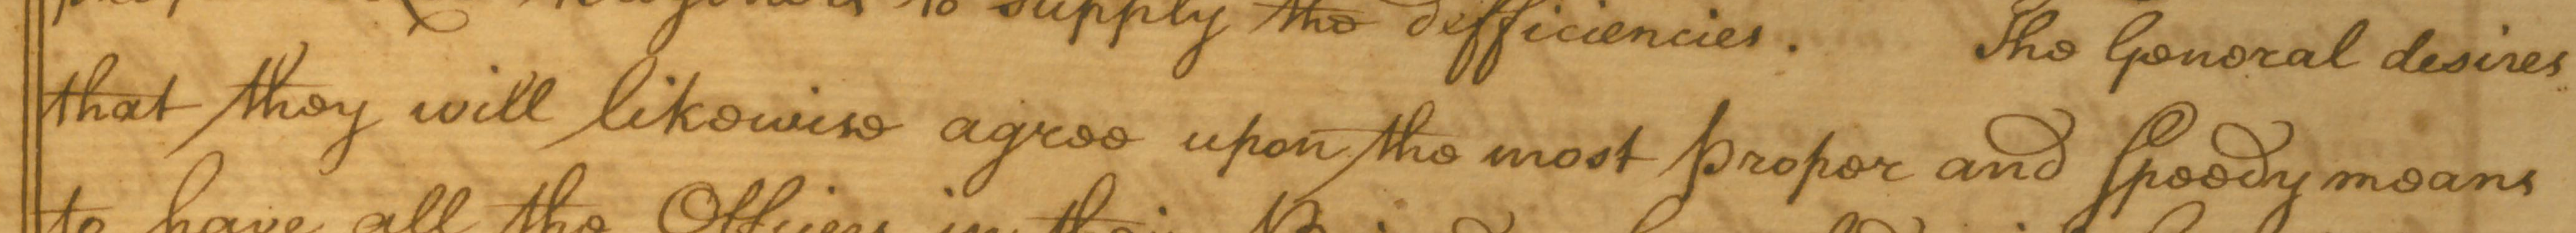that they will likewise agree upon the most proper and speedy means
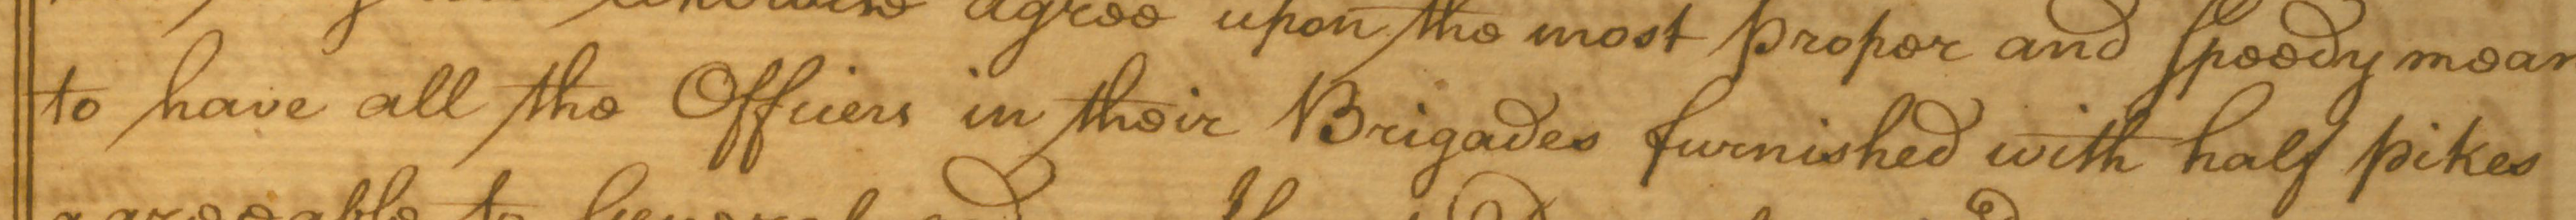to have all the Officers in their Brigades furnished with half pikes
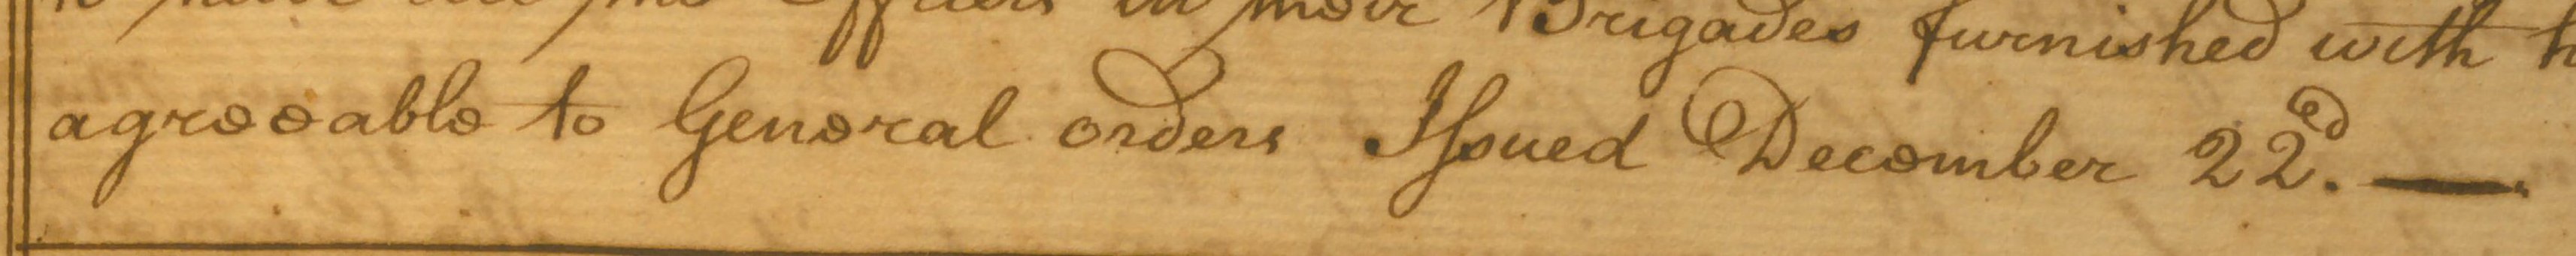agreeable to General orders Issued December 22^d.-
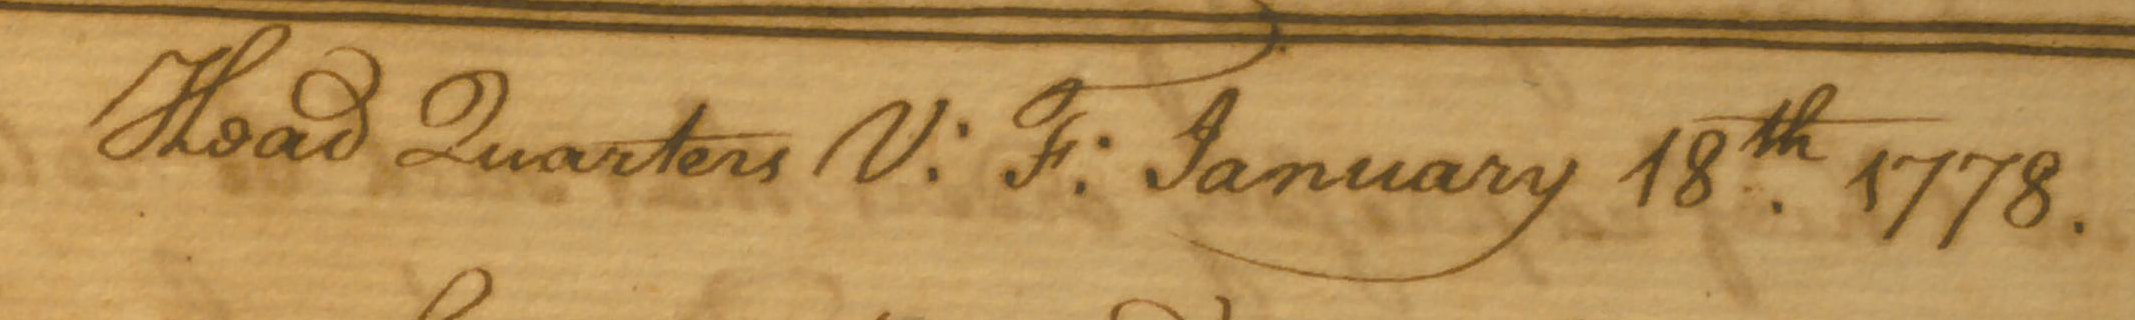Head Quarters V: F: January 18^th. 1778.
